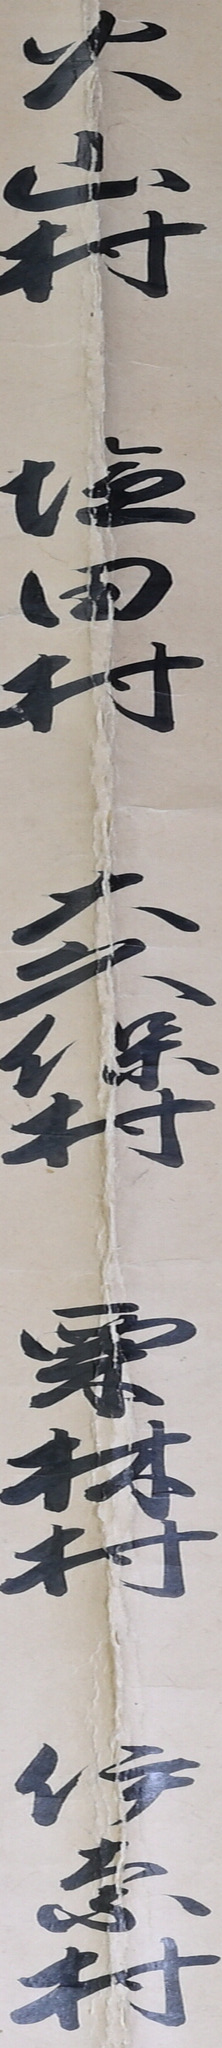火山村塩田村大久保村栗林村伊奈村
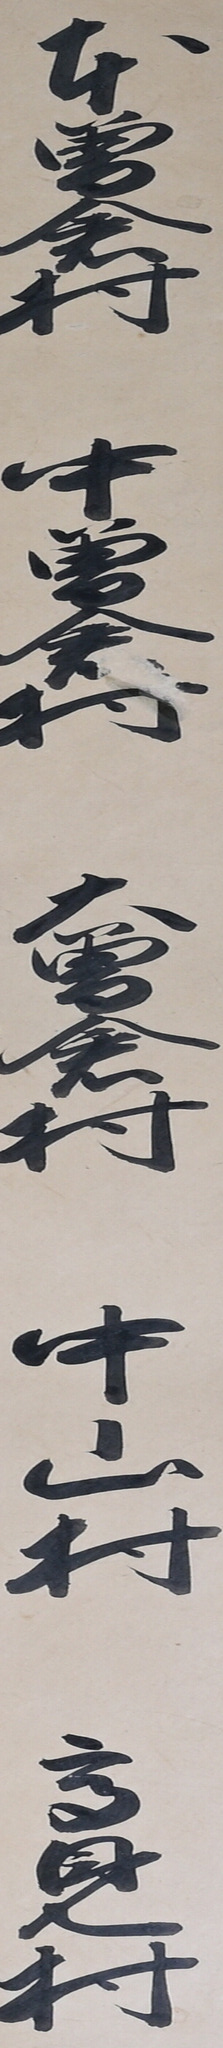本曽倉村中曽倉村大曽倉村中山村高見村
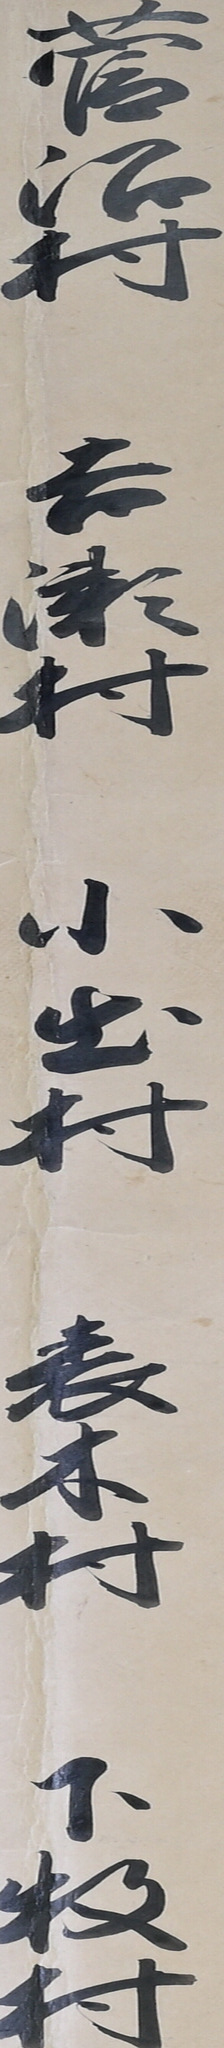菅沼村吉瀬村小出村表木村下牧村
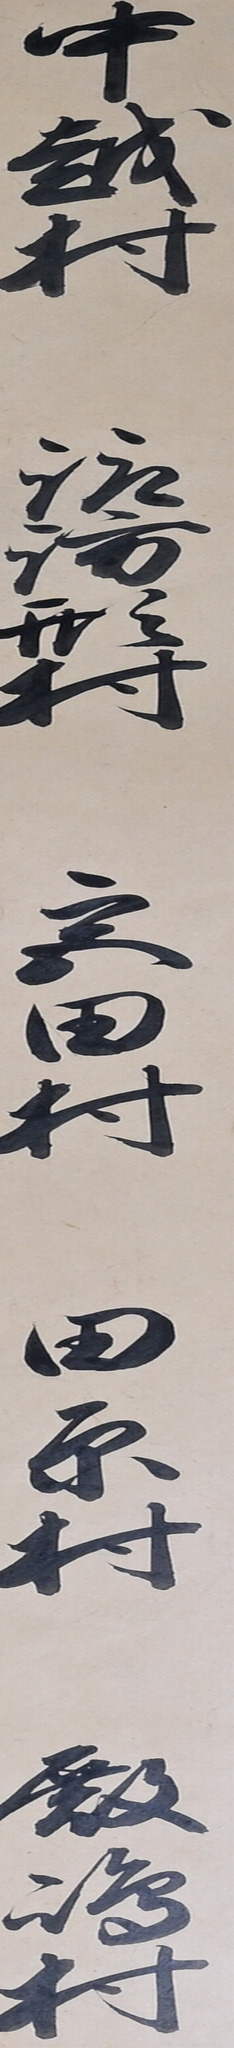中越村諏訪形村宮田村田原村殿嶋村
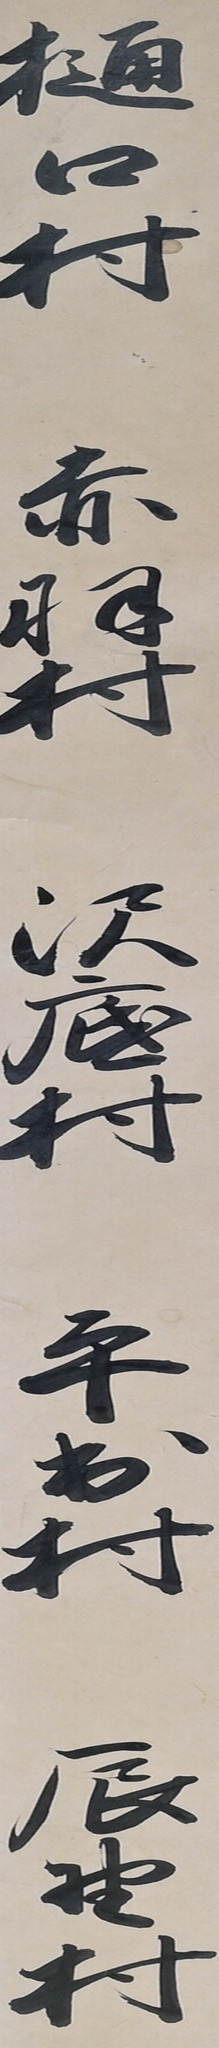樋口村赤羽村沢底村平出村辰野村
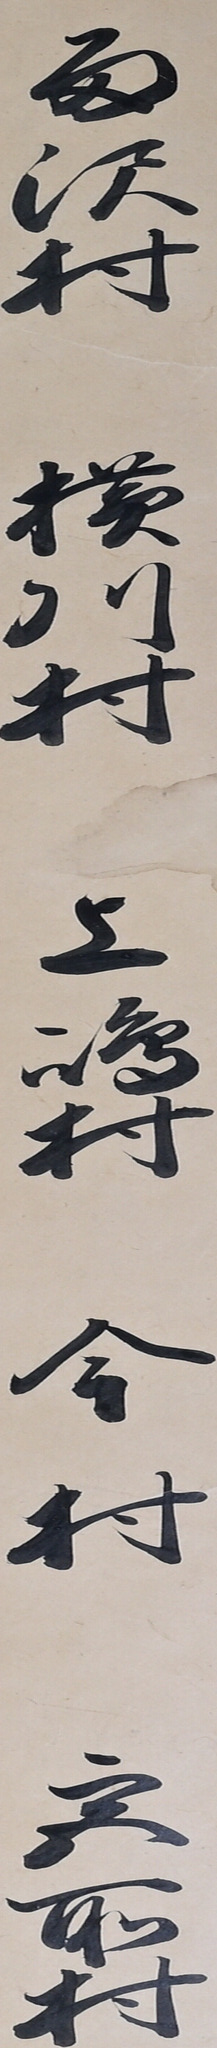雨沢村横川村上嶋村今村宮所村
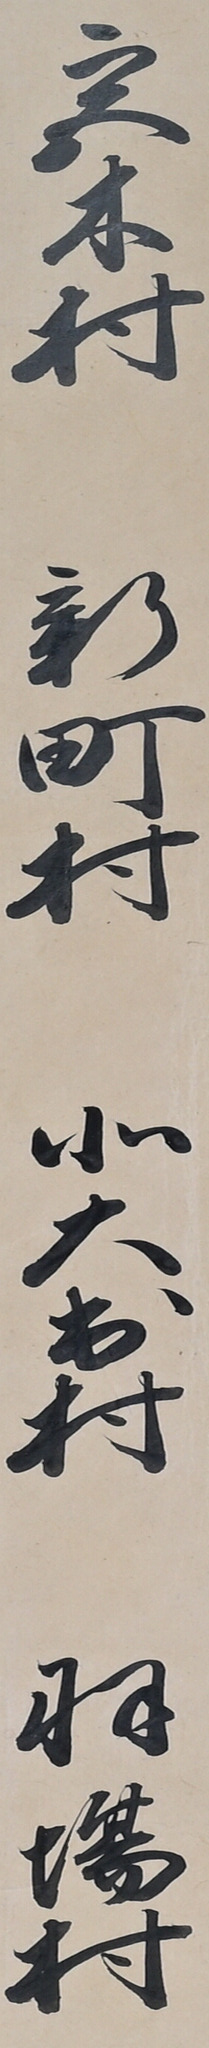宮木村新町村北大出村羽場村
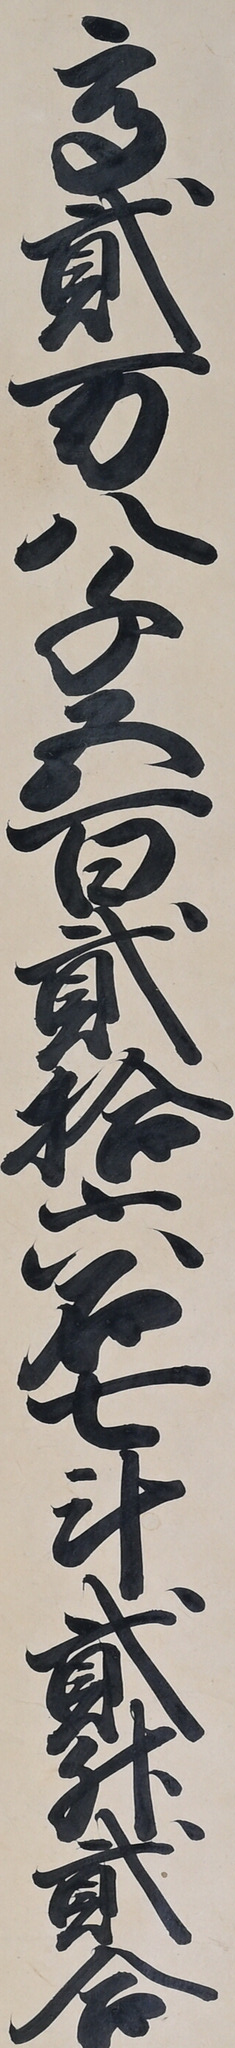高弐万八千五百弐拾六石七斗弐升弐合
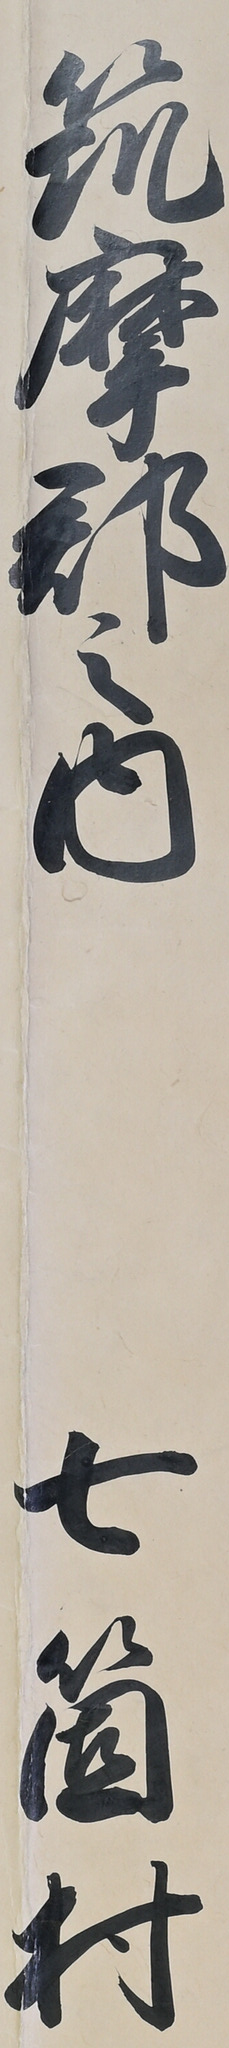筑摩郡之内七箇村
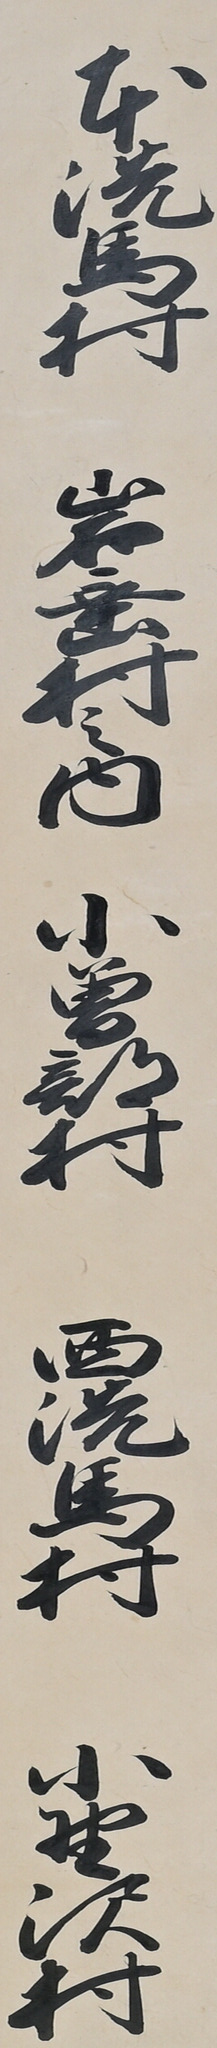本洗馬村岩垂村之内小曽部村西洗馬村小野沢村
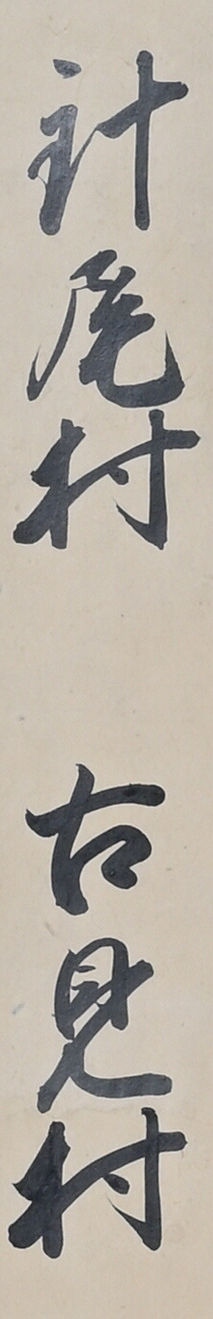針尾村古見村
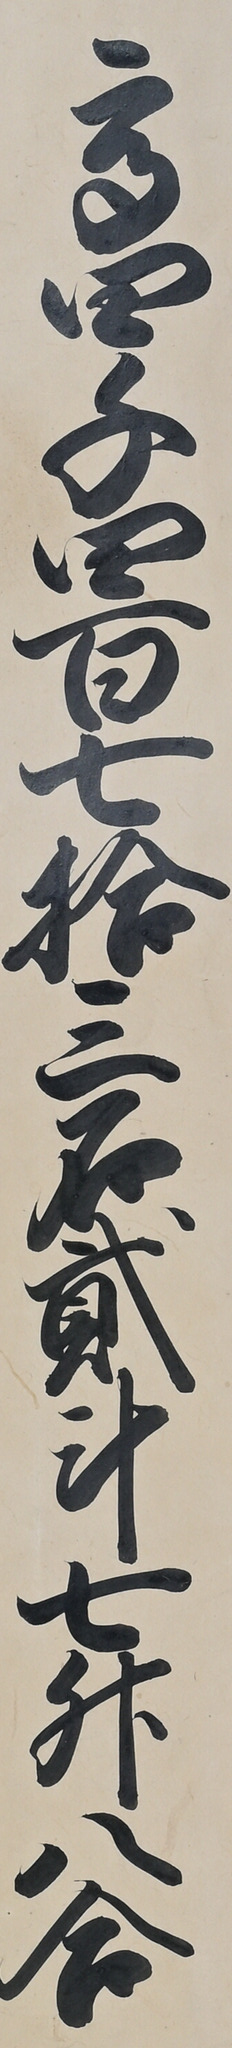高四千四百七拾三石弐斗七升八合
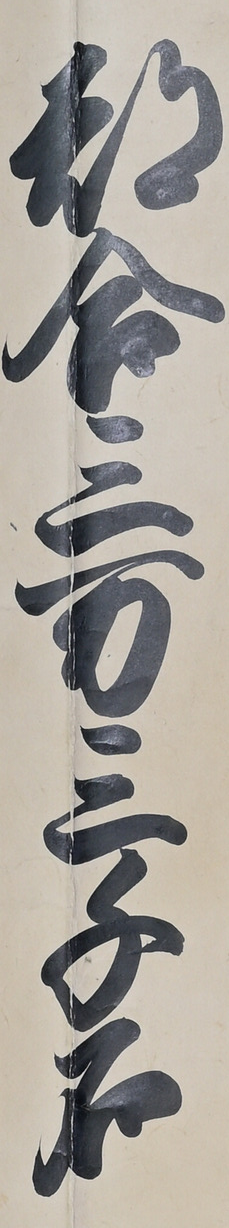都合三万三千石
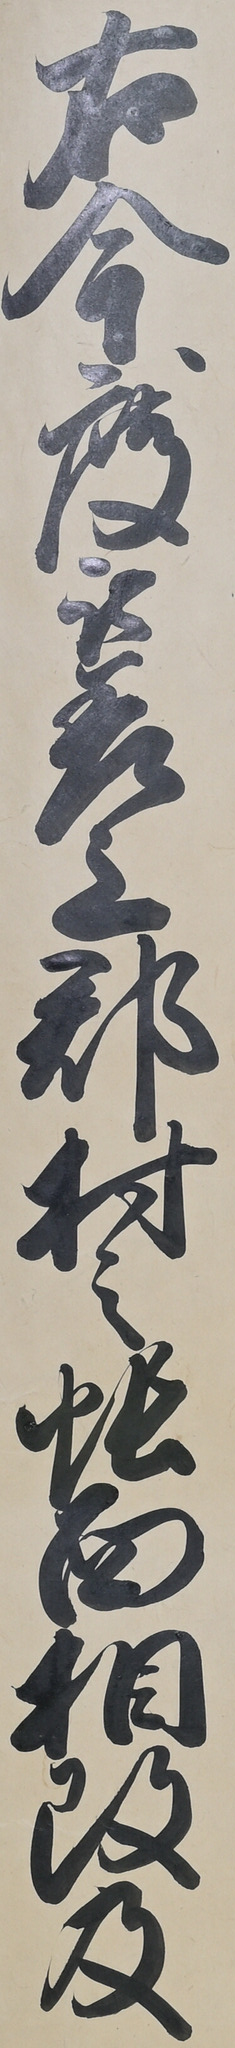右今度被差上郡村之帳面相改及

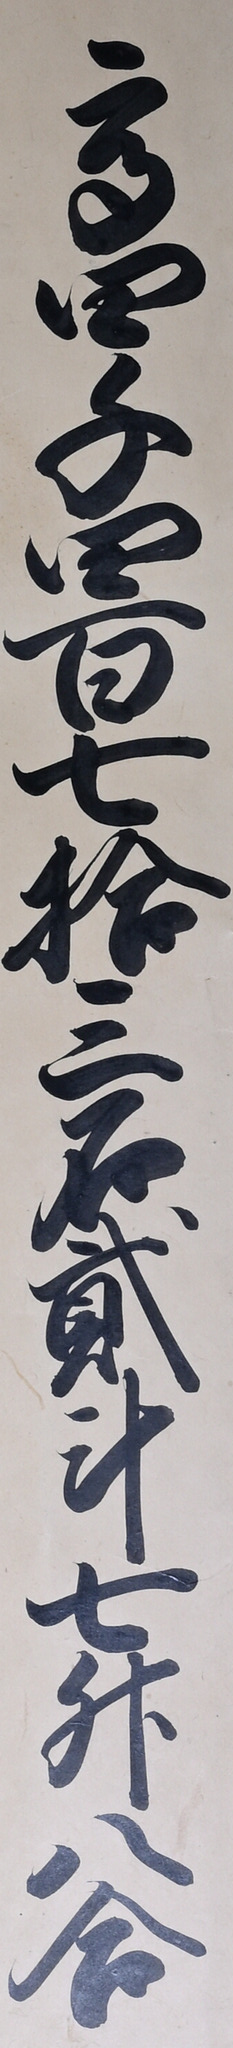高四千四百七拾三石弐斗七升八合
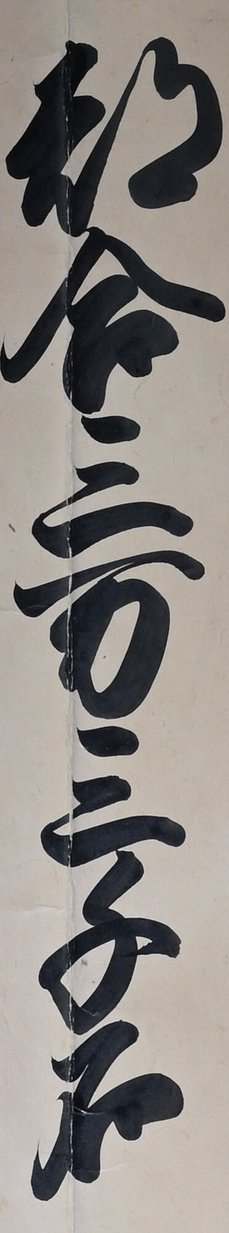都合三万三千石
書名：御領地目録
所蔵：伊那市立高遠町図書館・合同会社AMANE
